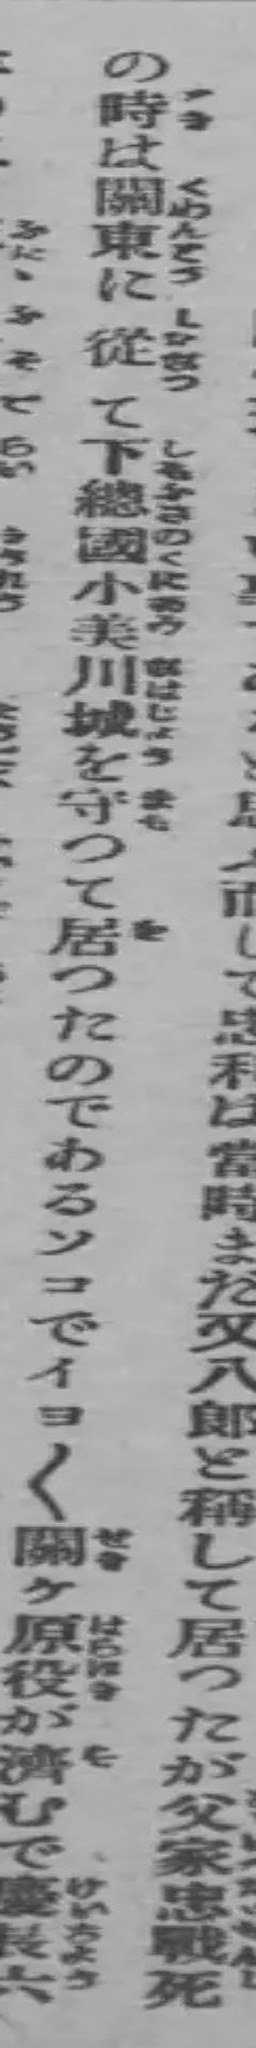の時は関東に従て下総国小美川城を守つて居つたのであるソコでイヨ〳〵関ケ原役が済むで慶長六
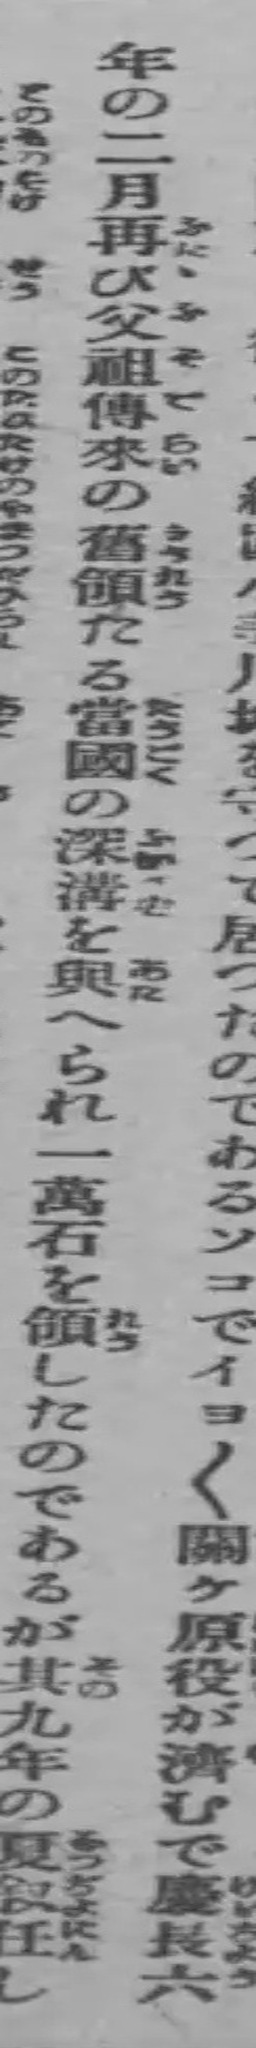年の二月再び父祖伝来の旧領たる当国の深溝を与へられ一万石を領したのであるが其九年の夏叙任し
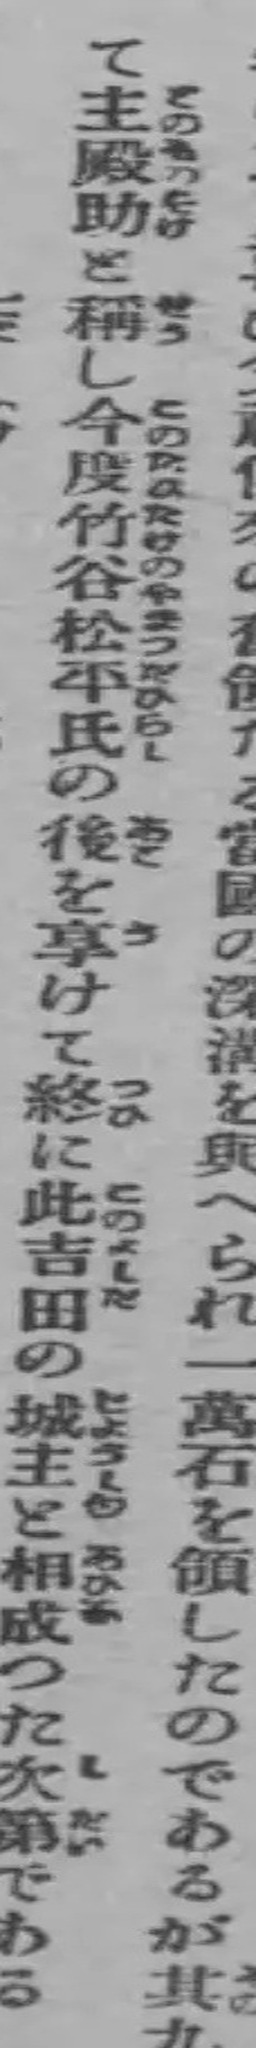て主殿助と称し今度竹谷松平氏の後を享けて終に此吉田の城主と相成つた次第である
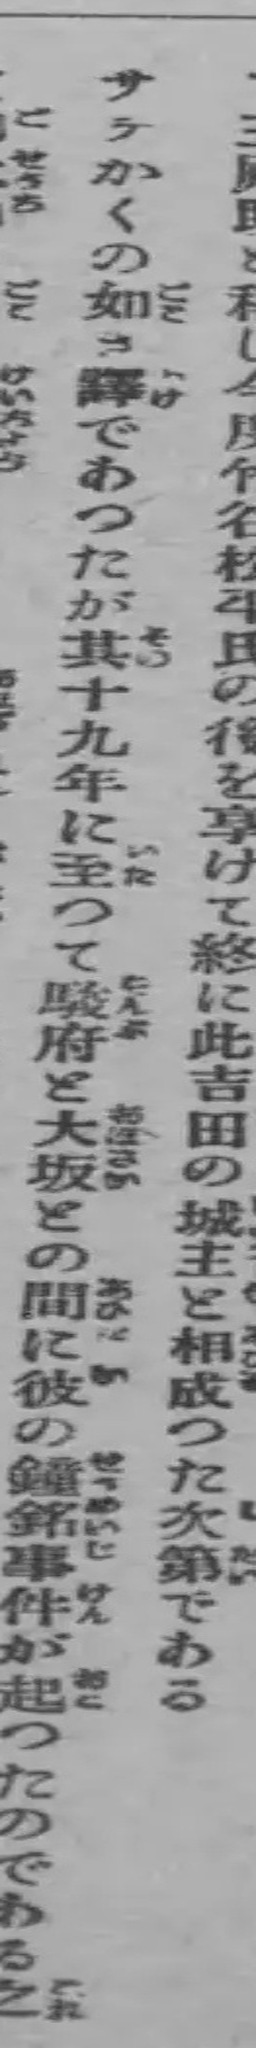鐘銘事件サテかくの如き訳であつたが其十九年に至つて駿府と大坂との間に彼の鐘銘事件が起つたのである之
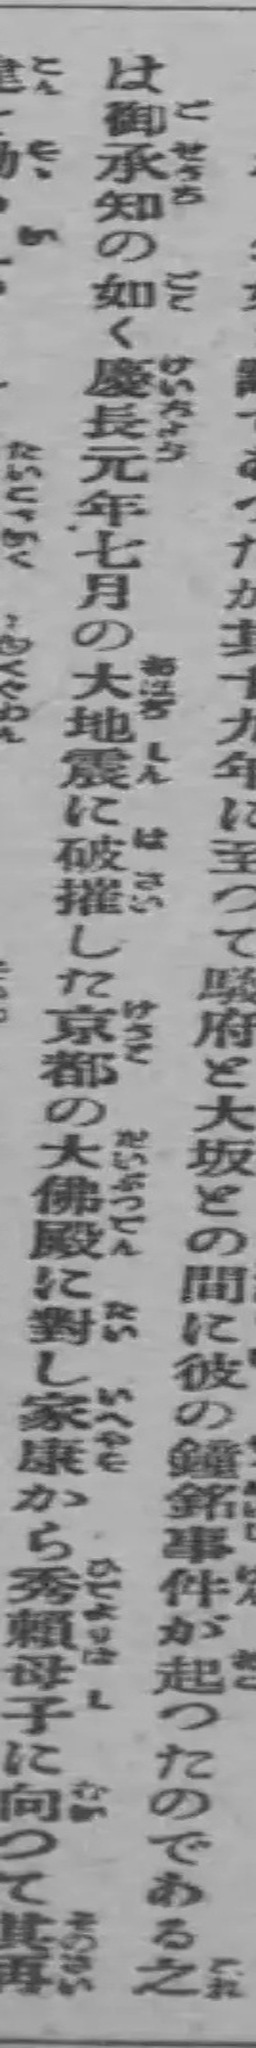は御承知の如く慶長元年七月の大地震に破摧した京都の大仏殿に対し家康から秀頼母子に向つて其再
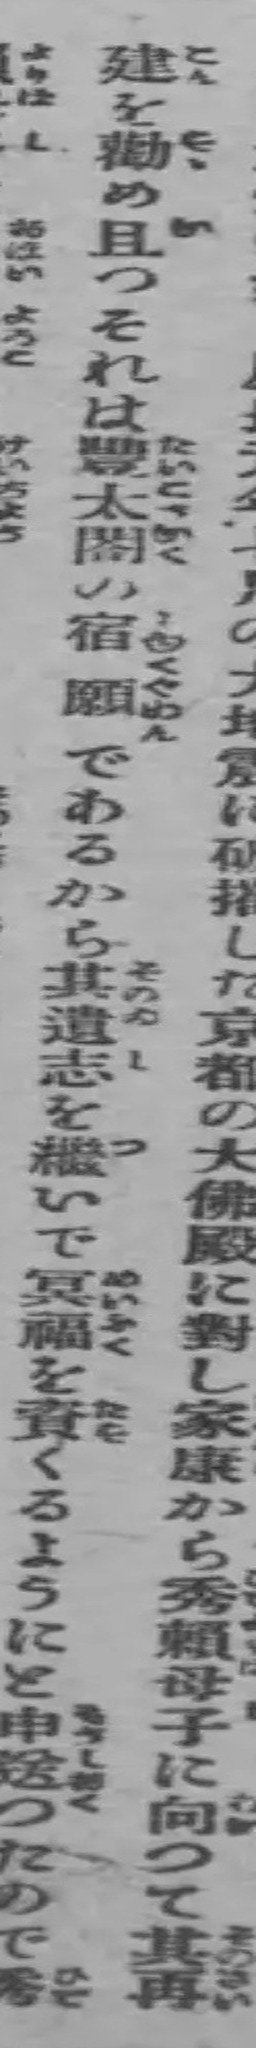建を勧め且つそれは豊太閤の宿願であるから其遺志を継いで冥福を資くるようにと申送つたので秀
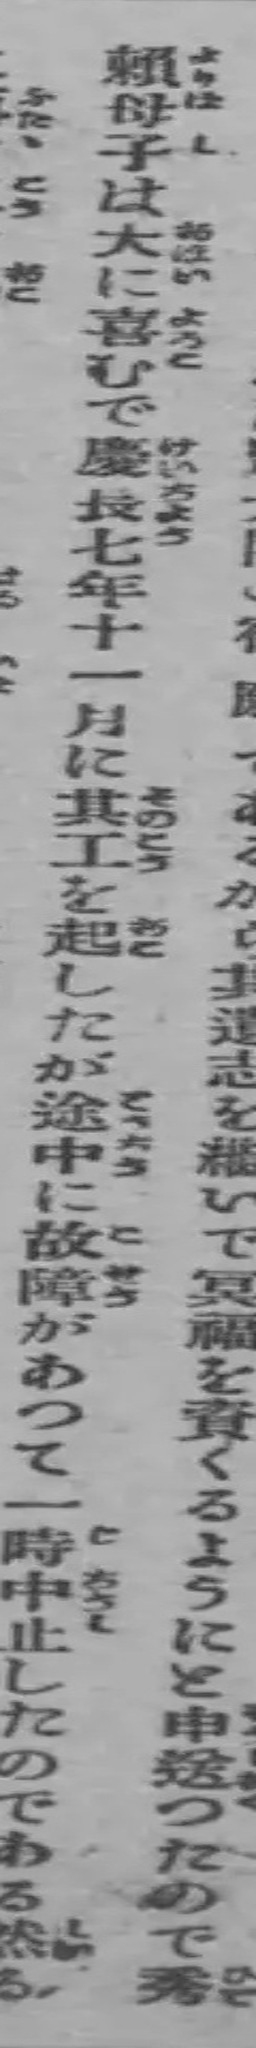頼母子は大に喜むで慶長七年十一月に其工を起したが途中に故障があつて一時中止したのである然る
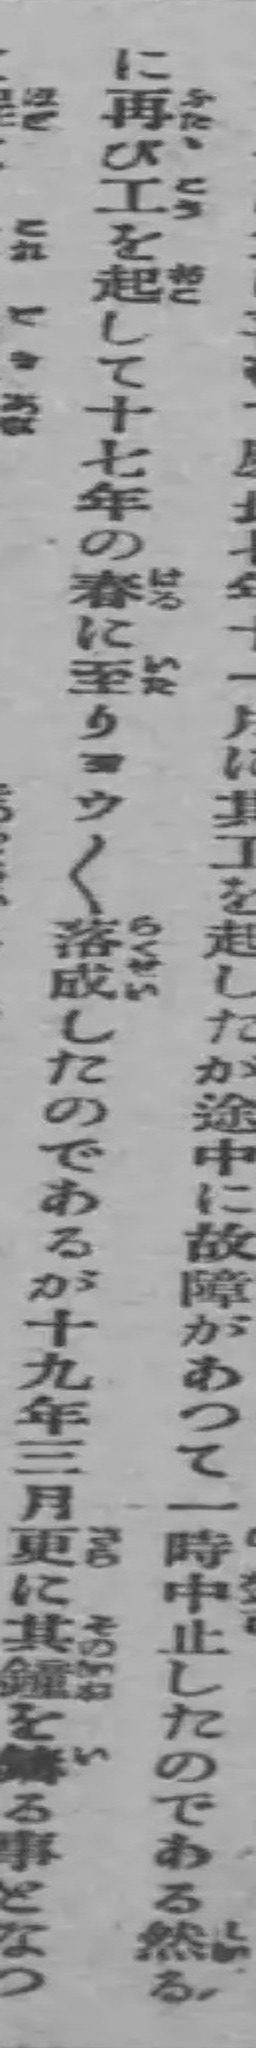に再び工を起して十七年の春に至りヨウ〳〵落成したのであるが十九年三月更に其鐘を鋳る事となつ
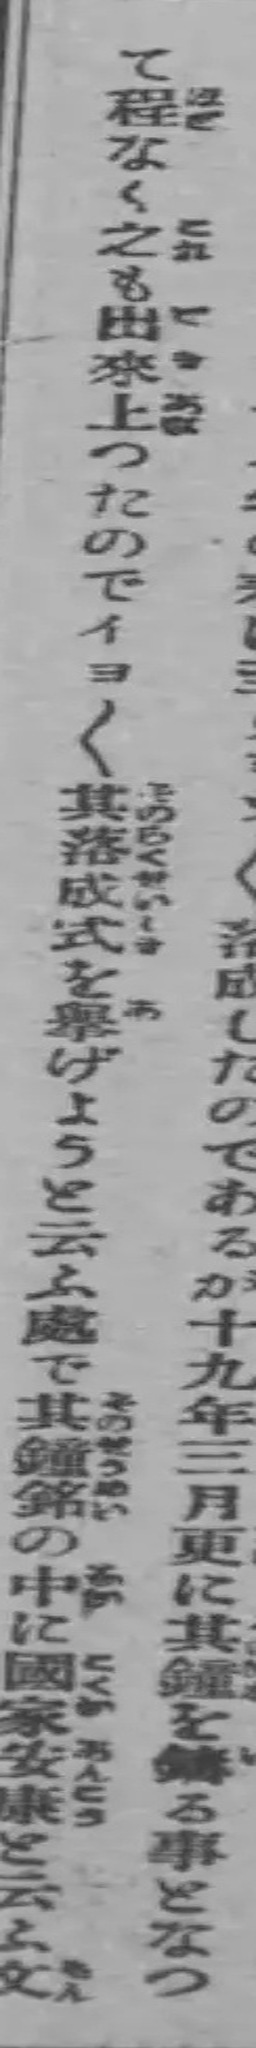て程なく之も出来上つたのでイヨ〳〵其落成式を挙げようと云ふ処で其鐘銘の中に国家安康と云ふ文
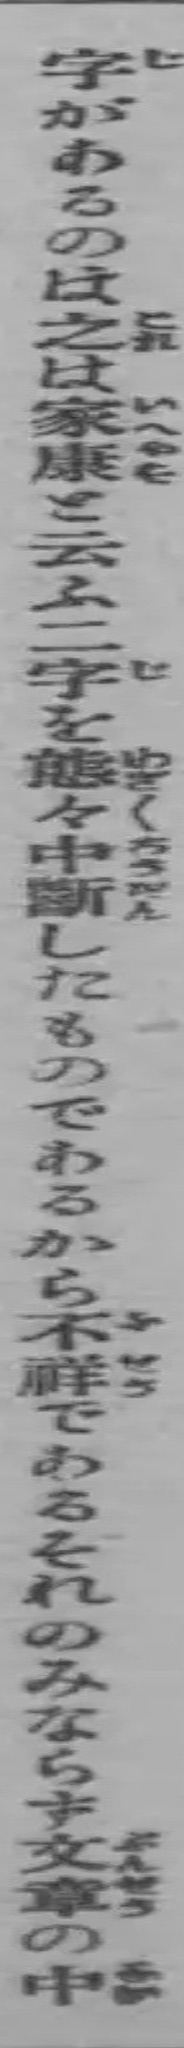字があるのは之は家康と云ふ二字を態々中断したものであるから不祥であるそれのみならず文章の中
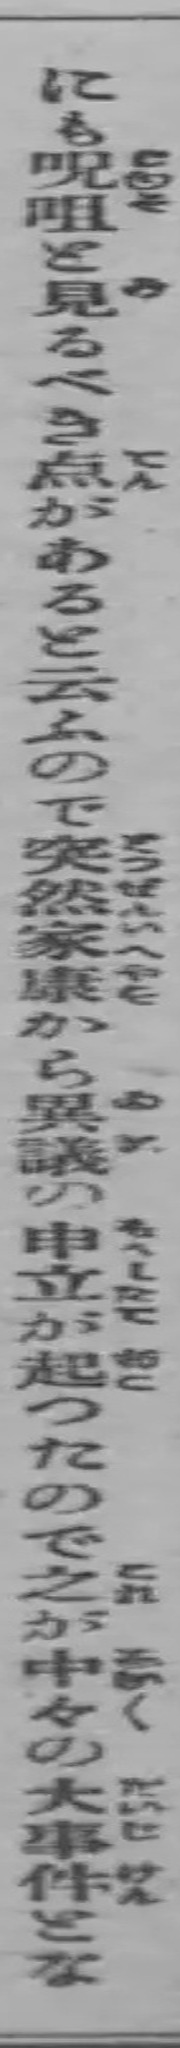にも呪詛と見るべき点があると云ふので突然家康から異議の申立が起つたので之が中々の大事件とな
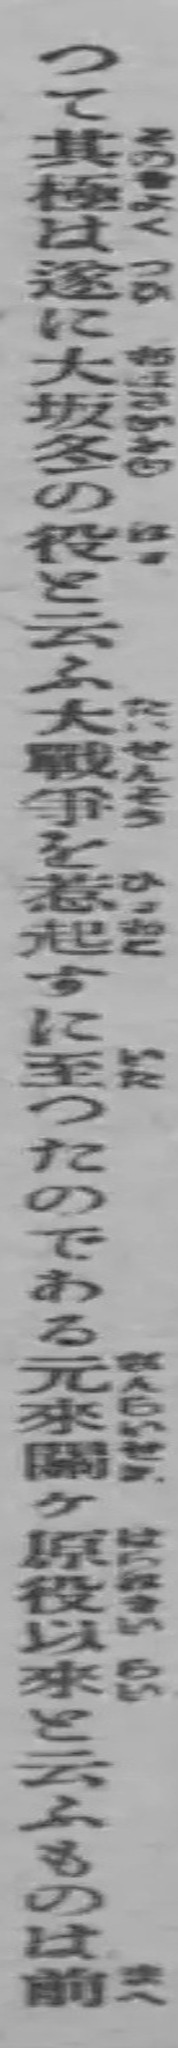つて其極は遂に大坂冬の役と云ふ大戦争を惹起すに至つたのである元来関ヶ原役以来と云ふものは前
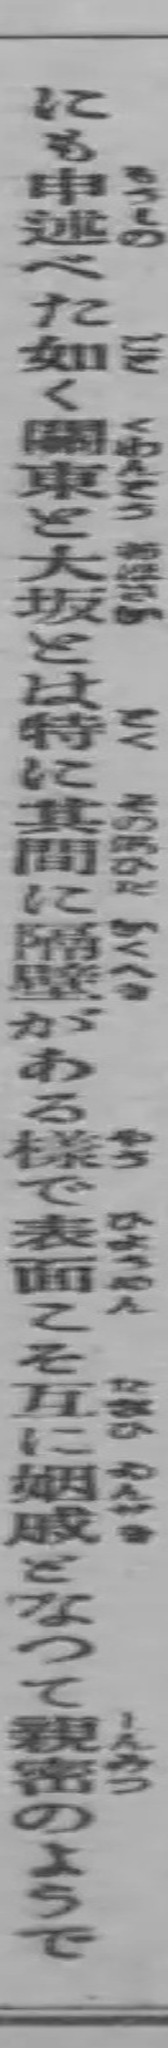にも申述べた如く関東と大坂とは特に其間に隔壁がある様で表面こそ互に姻戚となつて親密のようで
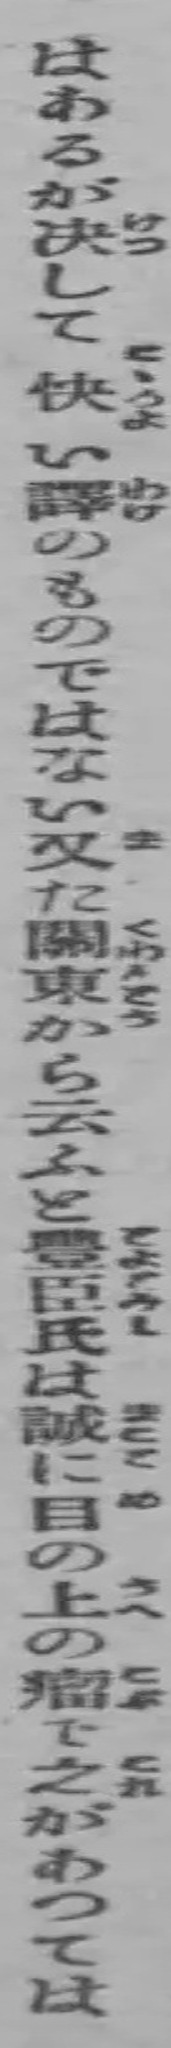はあるが決して快い訳のものではない又た関東から云ふと豊臣氏は誠に目の上の瘤で之があつては
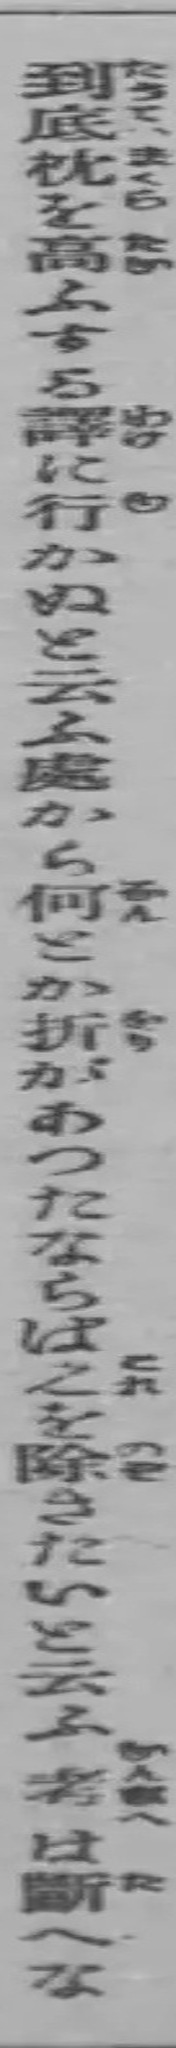到底枕を高ふする訳に行かぬと云ふ処から何とか折があつたならば之を除きたいと云ふ考は断へな
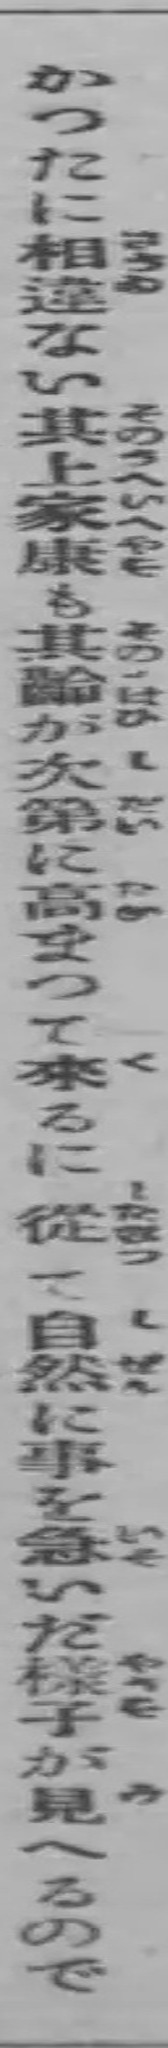かつたに相違ない其上家康も其齢が次第に高まつて来るに従て自然に事を急いだ様子が見へるので
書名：豊橋市史談
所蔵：国立国会図書館 National Diet Library, JAPAN
